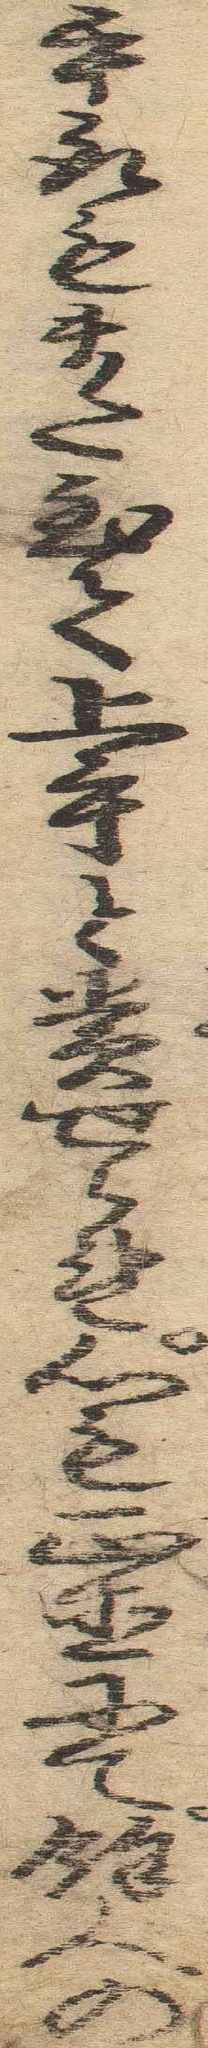手取もまた至て上手と賞せられ。心も正直にて。餘人の

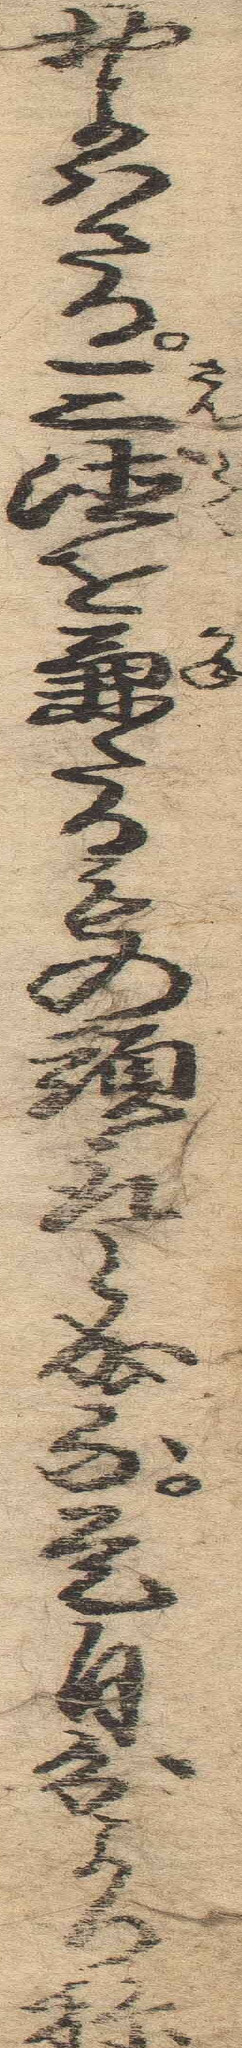およはさる。三徳を兼たるもの頭取と成る。是自分より称
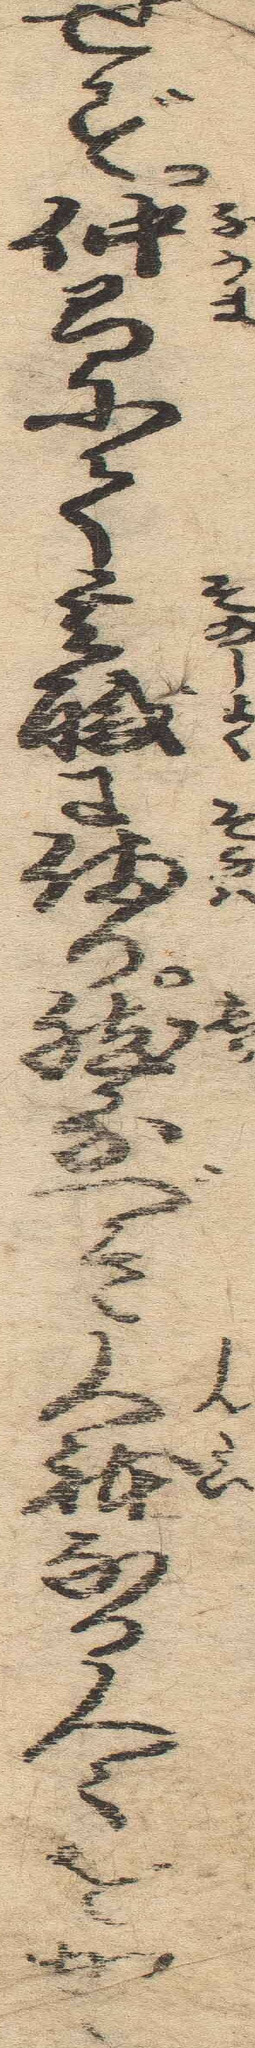せず。仲間にて其職に備り。然るべき人体なる人々をかく
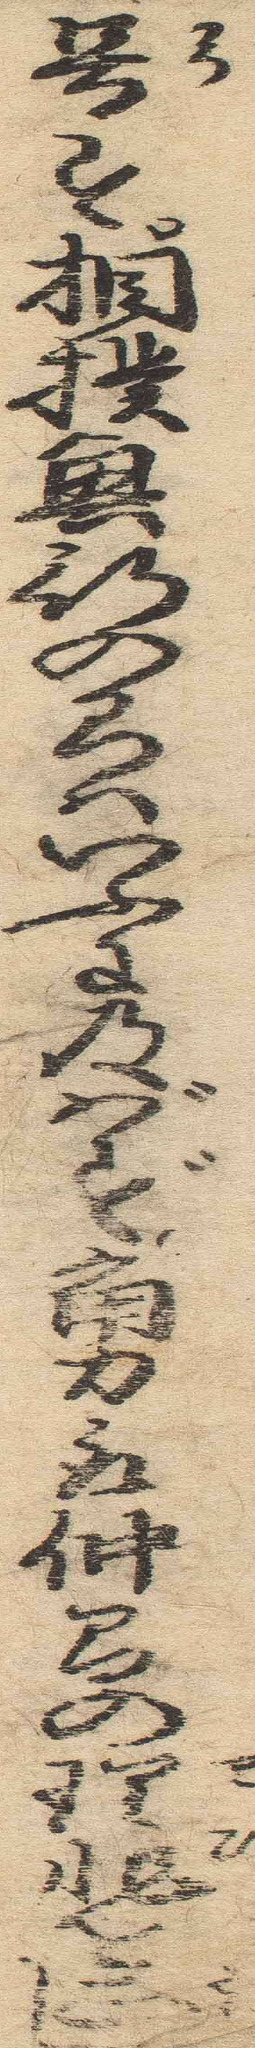号す。相撲興行の間はいふに及ばず。角力取仲間の理非を正し。
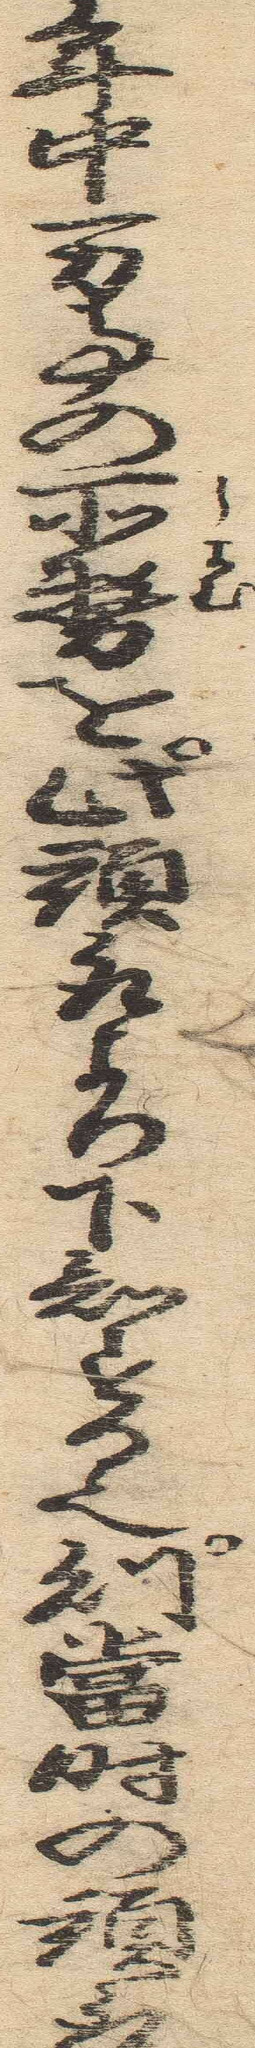年中万事の所務を。此頭取より下知する也。則当時の頭取
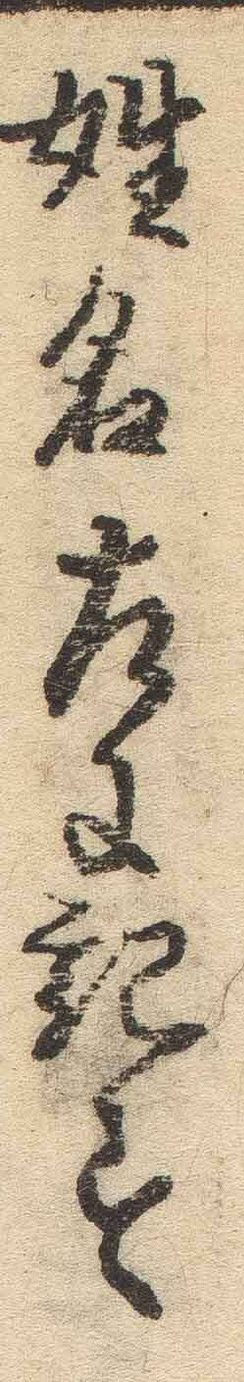姓名左に記す
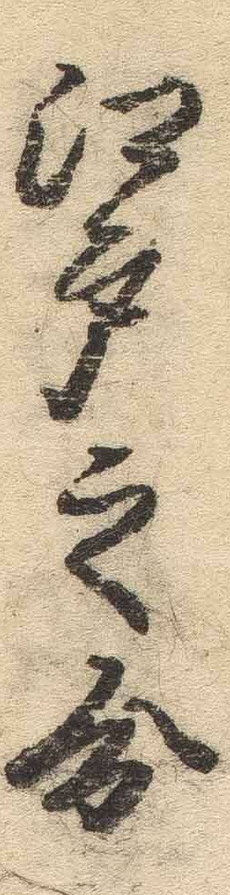江戸之分
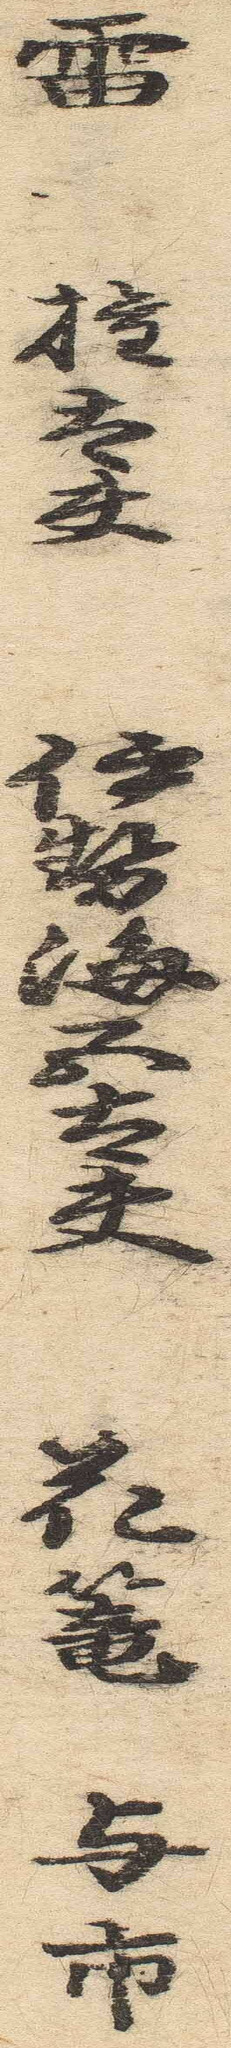雷権太夫伊勢海五太夫花籠与市
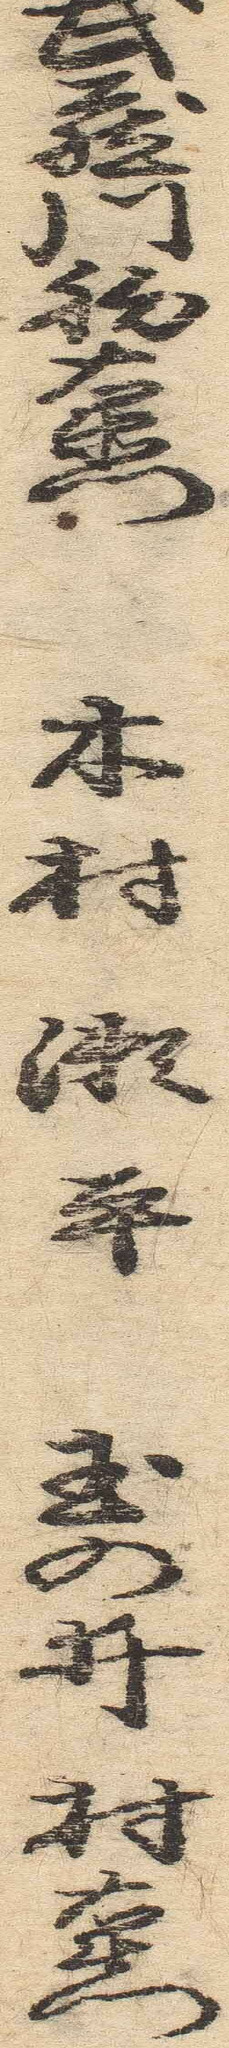武蔵川初右衛門木村瀬平玉の井村右衛門
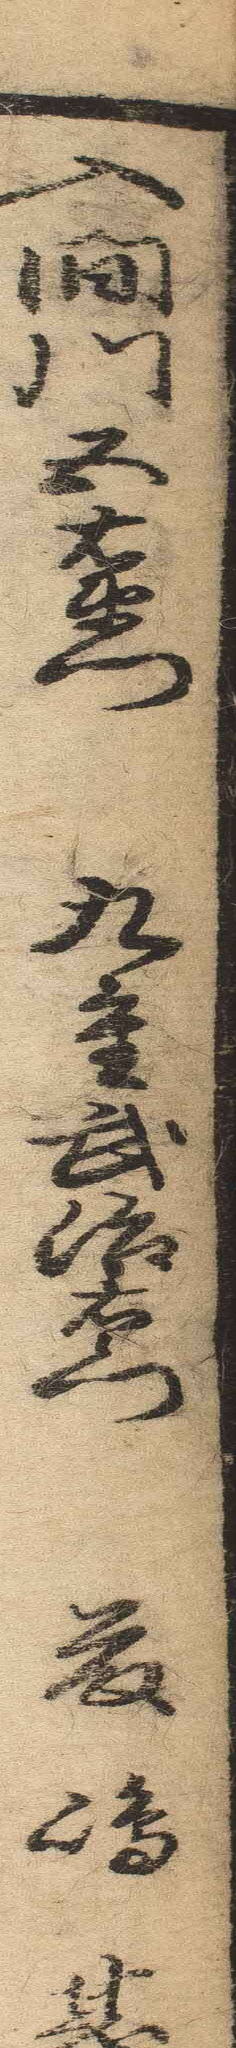入間川五右衛門九重武治右衛門前嶋甚八
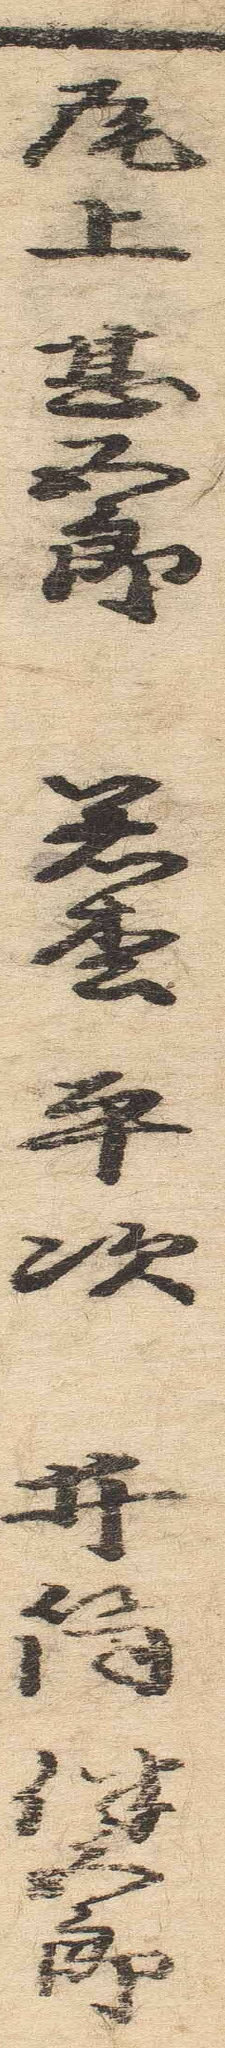尾上甚五郎若松平次井筒伴五郎
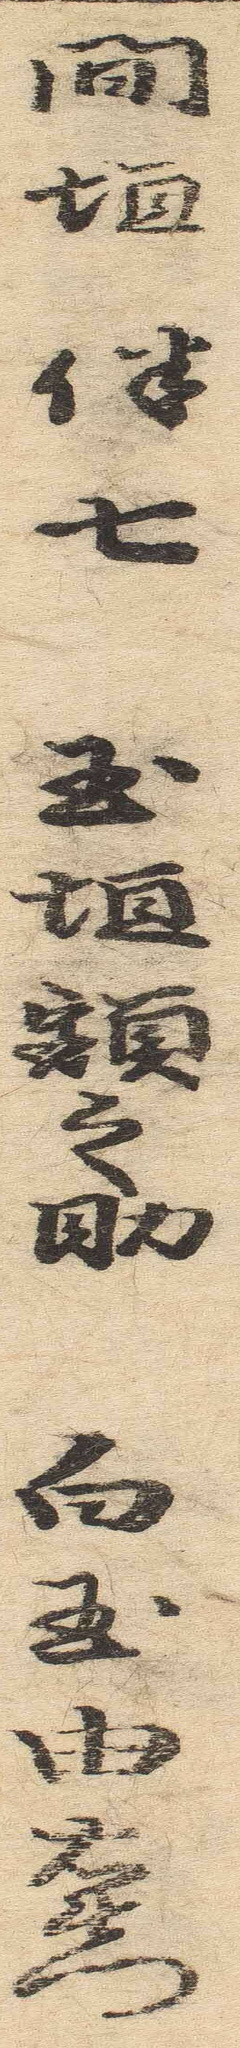間垣伴七玉垣額之助白玉由右衛門
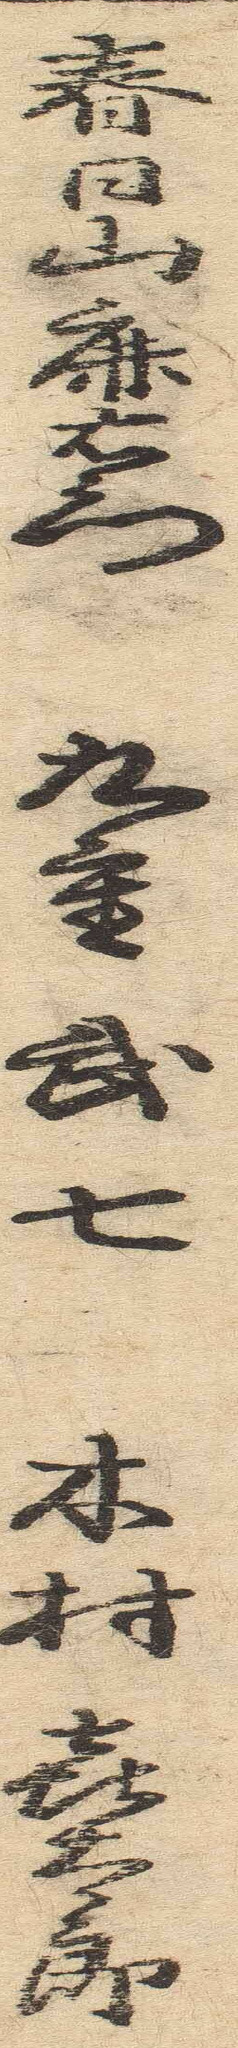春日山鹿右衛門九重武七木村喜太郎
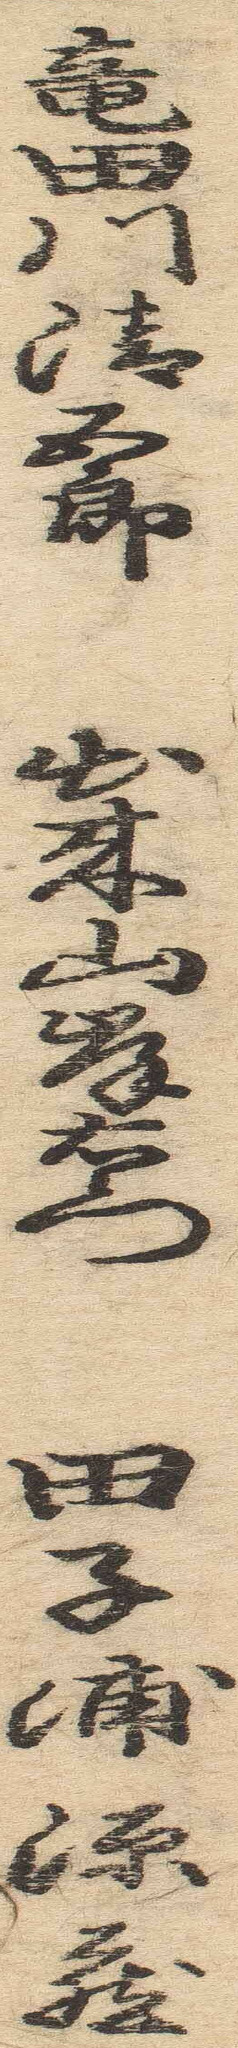竜田川清五郎出来山岸右衛門田子浦源蔵
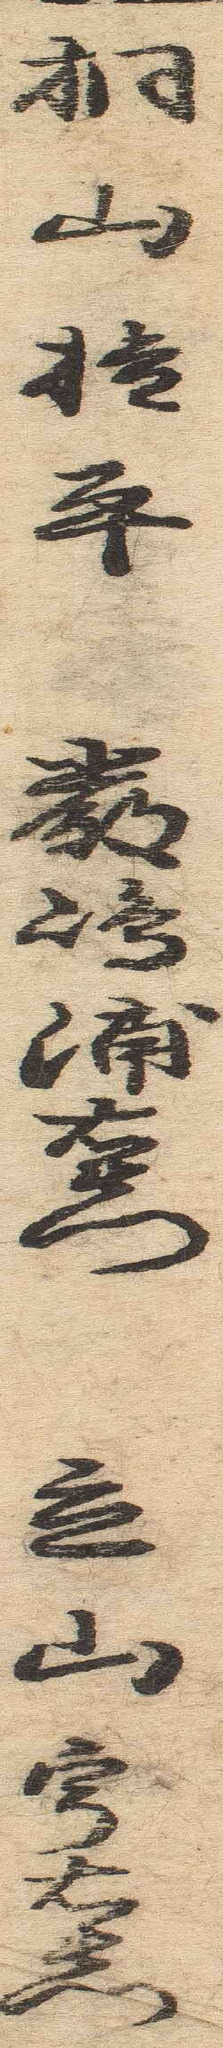桐山権平嶺嶋浦右衛門立山宇右衛門
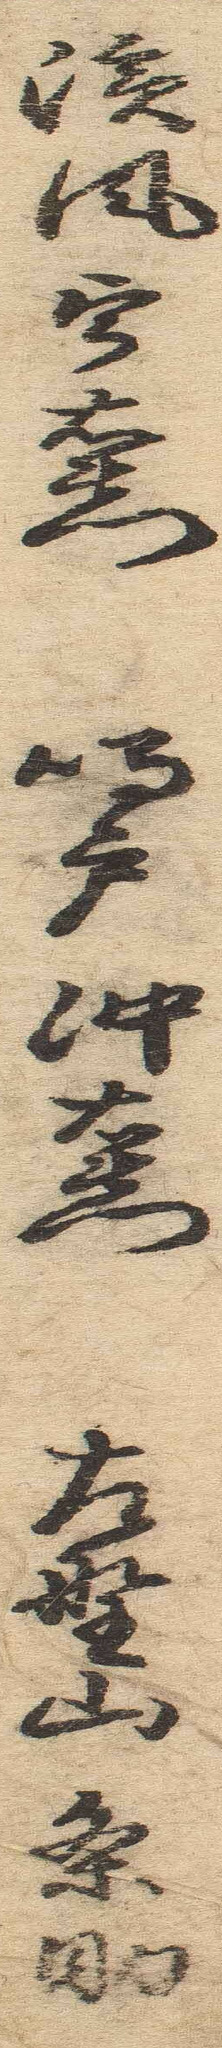濱風宇右衛門鳴戸沖右衛門左野山条助
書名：古今相撲大全
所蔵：東京学芸大学附属図書館 国文学研究資料館
